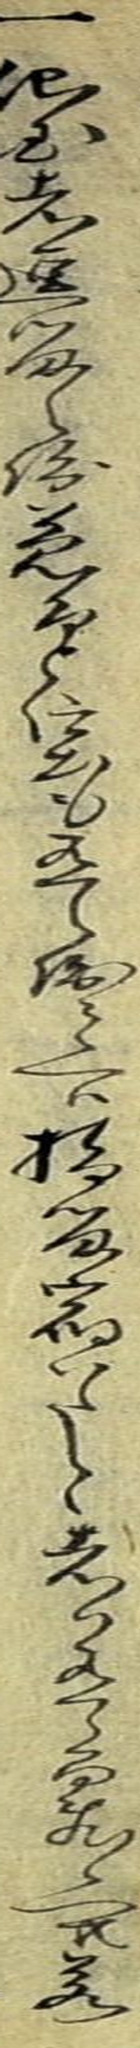一他国者逗留之儀兼而被仰出も有之儀ニ候ヘハ指留宿いたし候者ハ有之間敷候へ共若
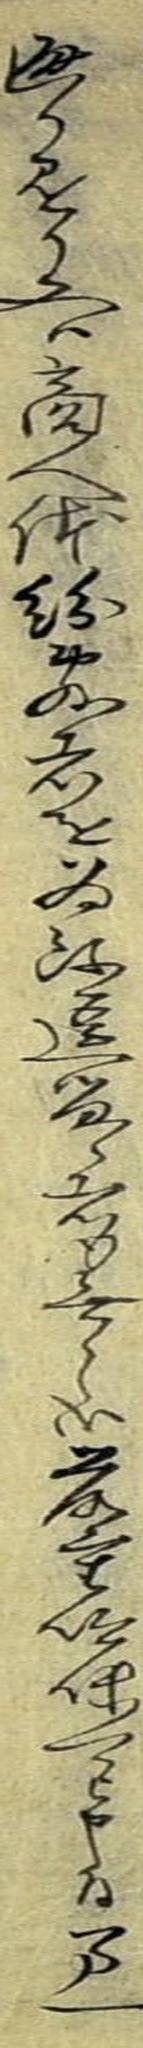通り懸り又ハ商人体紛敷者を為致逗留候者も無之哉厳重吟味可被申付万一
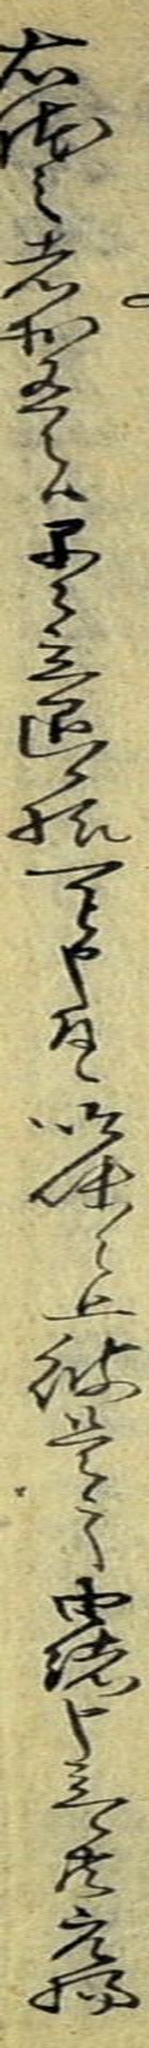右体之者於有之ハ早々立退候様可被申付候吟味之上彼是之由緒申立候共取揚
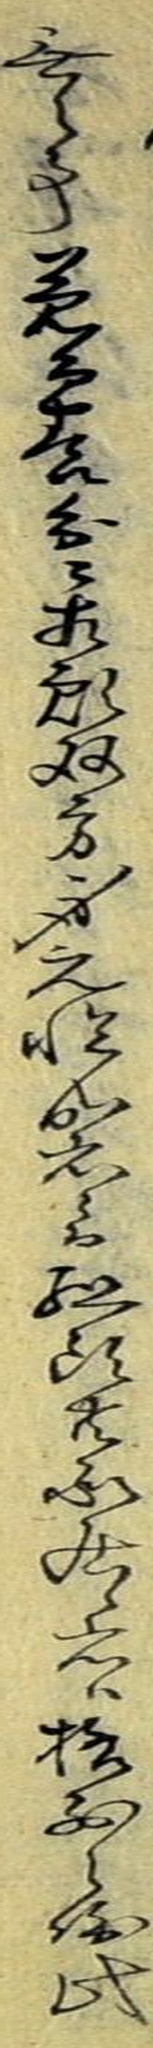無之事兼而養分ニ相願双方身元慥成者ニ而組頭共承居候者ハ格別之儀此

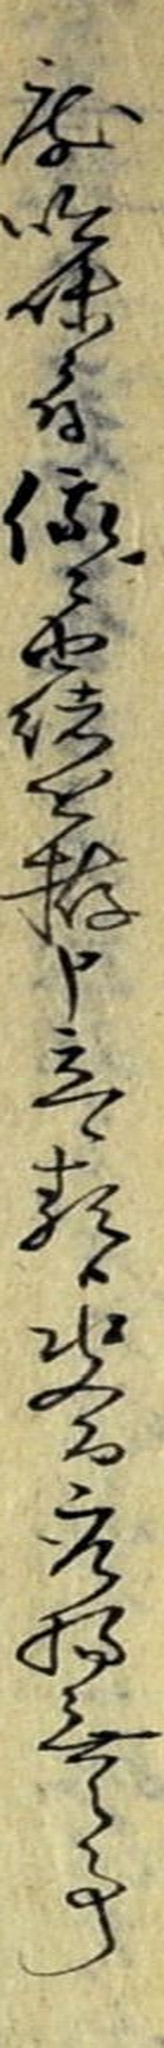度吟味ニ付俄ニ由緒を拵申立候類ハ決而取揚無之事
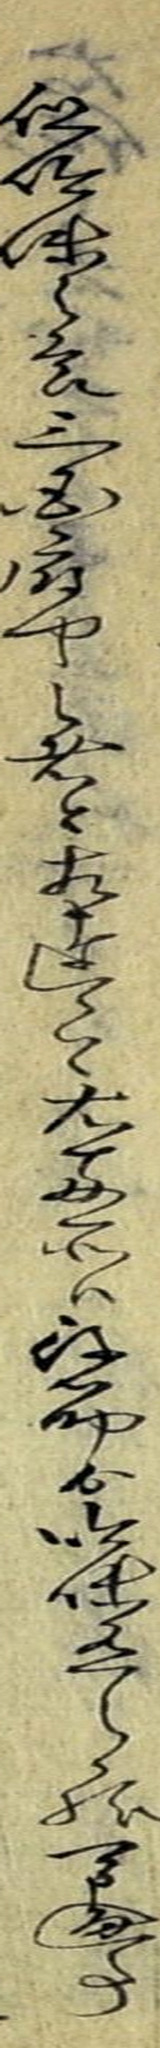但吟味之節三国府中之者と相達候ハヽ右両所ハ役筋ゟ吟味有之候様可申通事
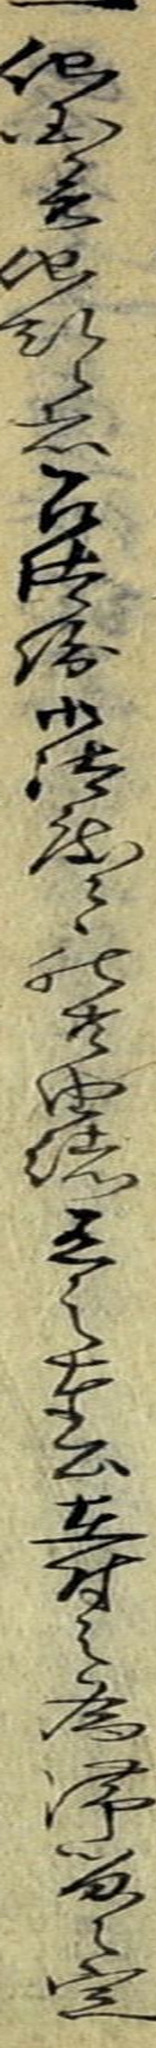一他国并他領之者召仕候儀御法度ニ候然共由緒有之奉公在付之為滞留之定
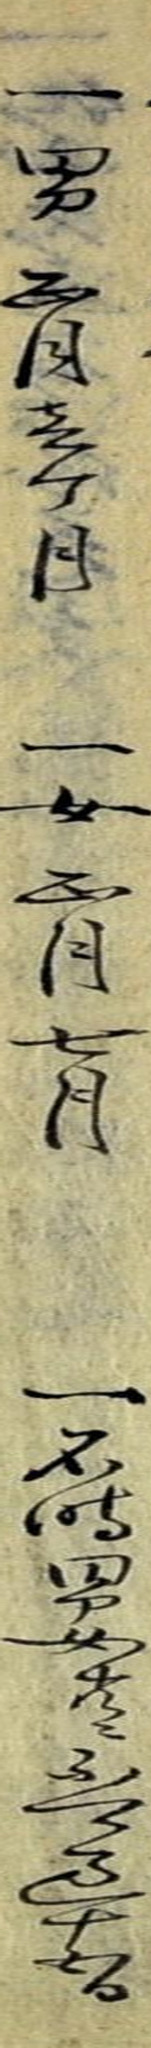一男正月壱ケ月一女正月七月一不時男女共ニ不可過十五日
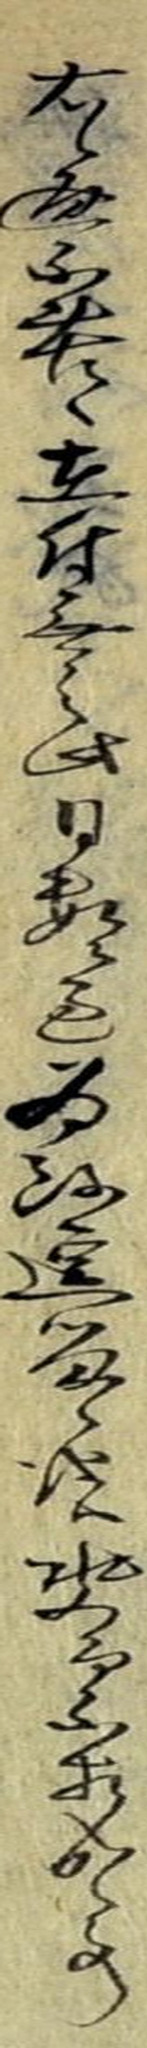右之通不苦候在付無之此日数ニ過為致逗留候儀ハ決而不相成候事
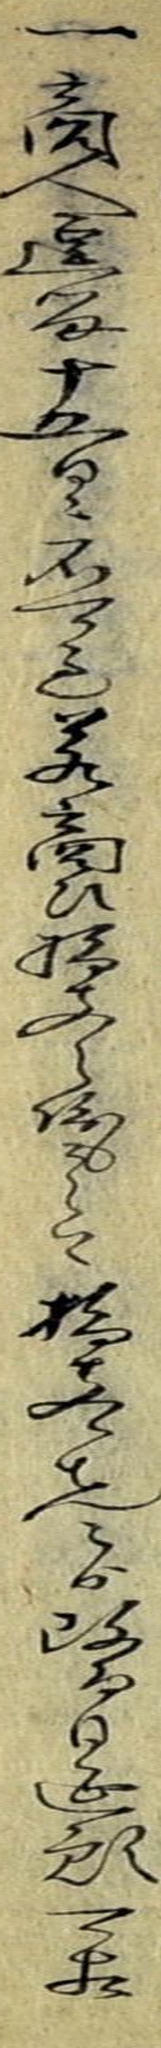一商人逗留十五日ニ不可過若商ひ指支之儀も候ハヽ指支候先々ゟ改而日延願可相
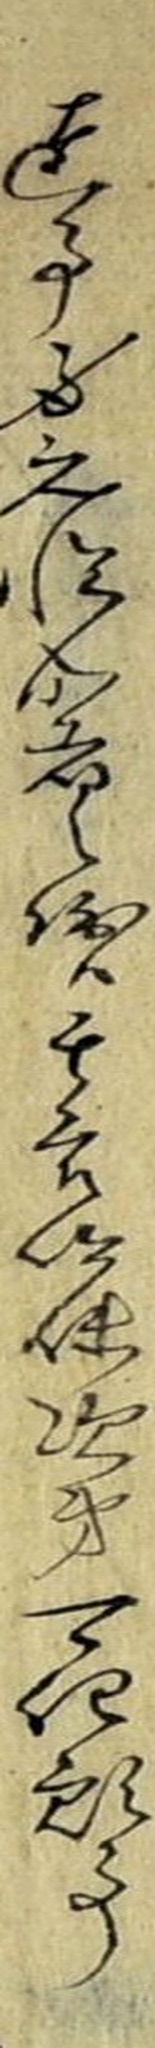達事身元慥成者之儀ハ其節吟味次第可任願事
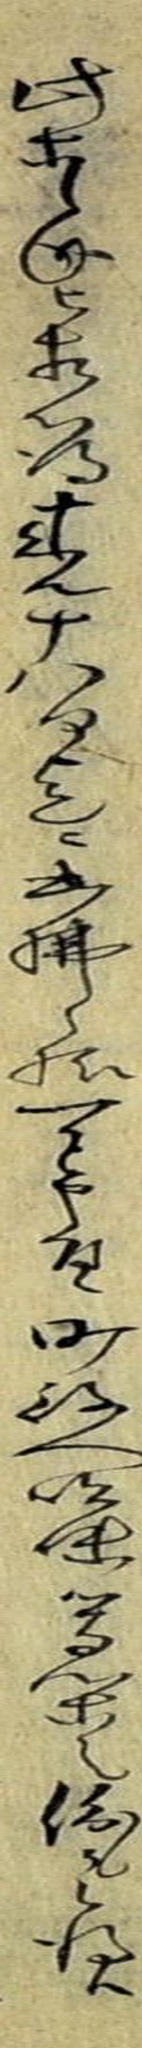此等之趣被相心得来ル十八日迄ニ出払候様可被申付候町役人吟味等閑之儀も候得ハ
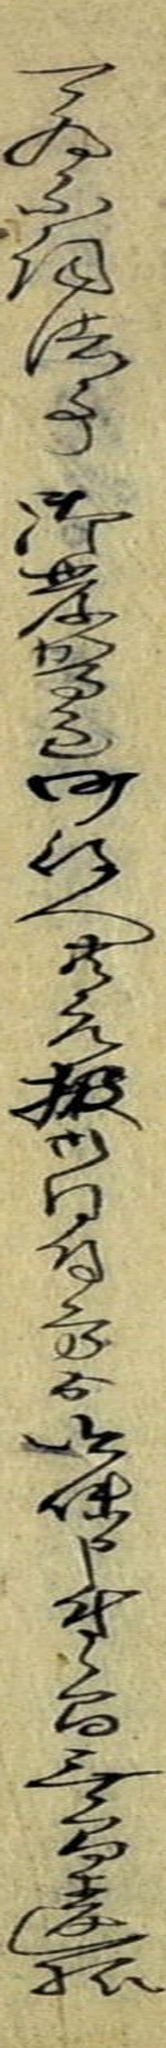可為不調法事御発駕過町役人共取扱御目付方ゟ吟味申付候間無間違様
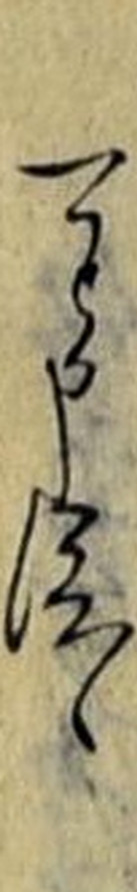可被申渡候
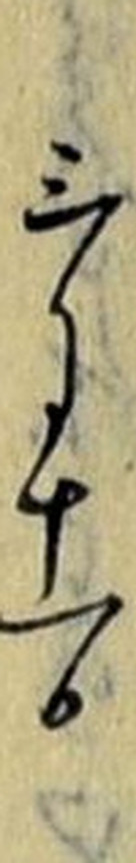三月十一日
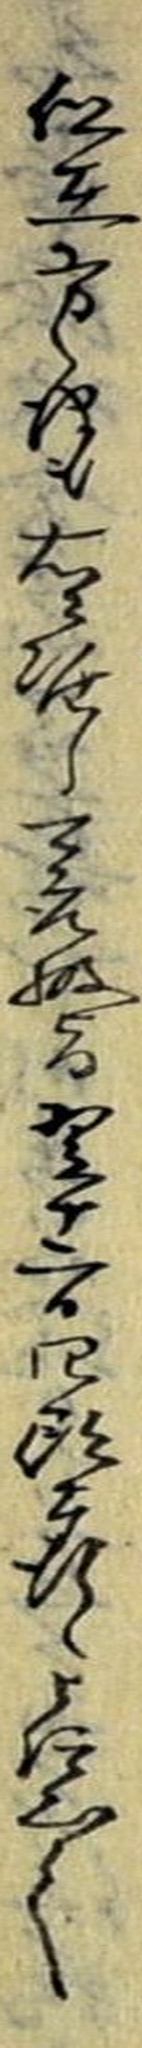但在方之儀も右ニ准し可取扱旨翌十二日四郡奉行へ被仰出之
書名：命令之部 三
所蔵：福井県文書館 Fukui Prefectural Archives
